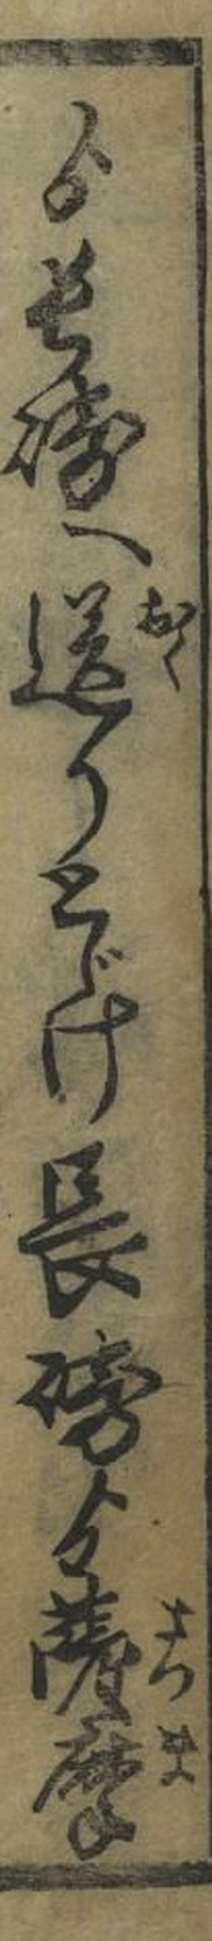より長崎へ送りとゞけ長崎ゟ薩摩
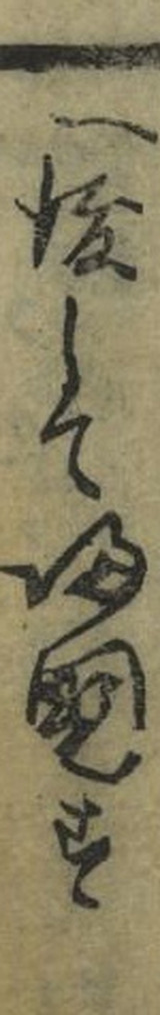へ渡して帰国す
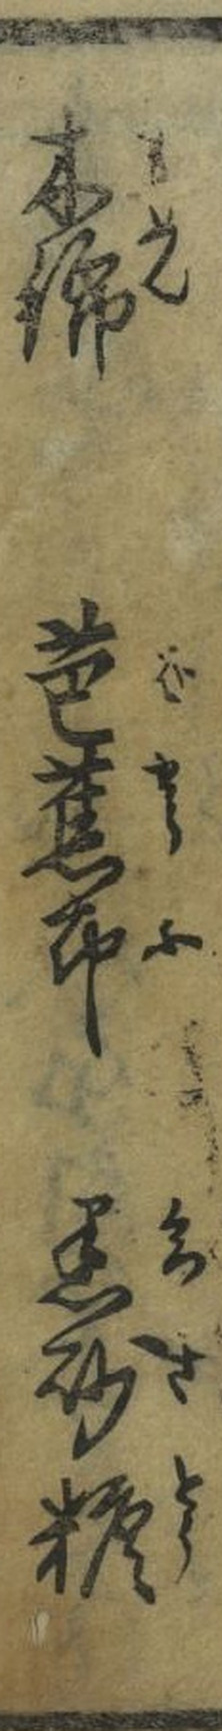木綿芭蕉布黒砂糖
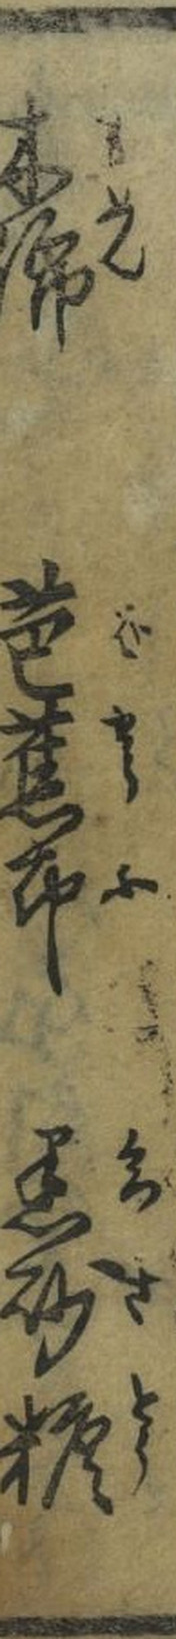木綿芭蕉布黒砂糖
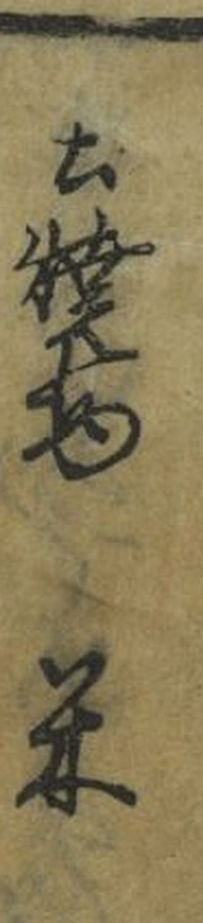土焼物米
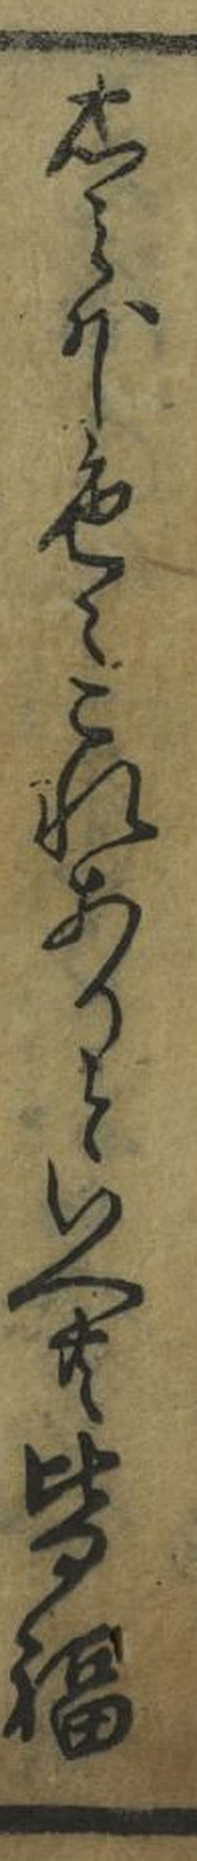右之外色々これありといへ共皆福
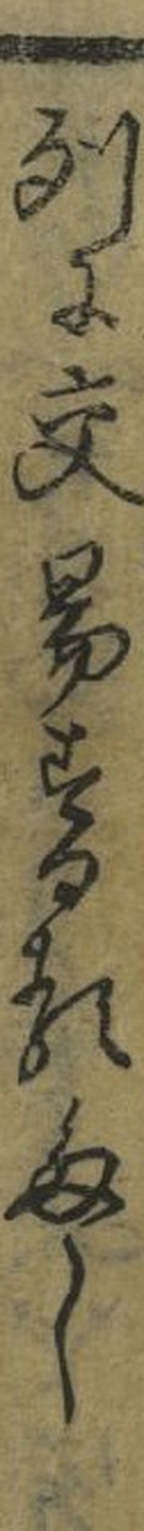州に交易する類多し
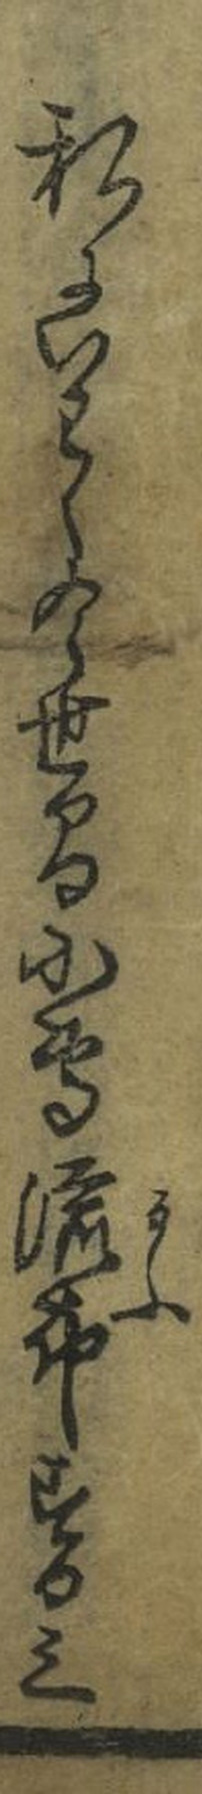私にいわく今世間に専流布する三
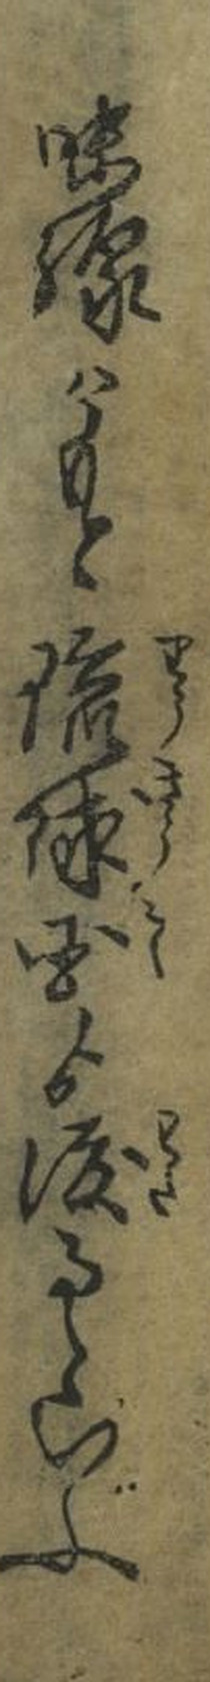味線はもと琉球国ゟ渡るといふ

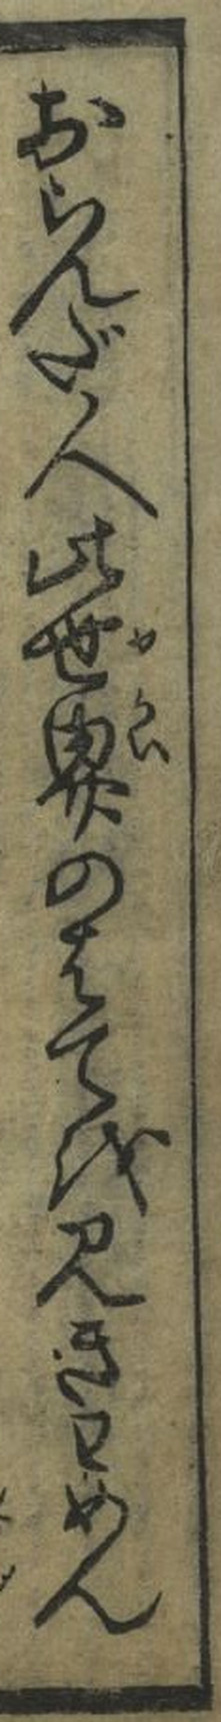おらんだ人此世界のはてを見きわめん
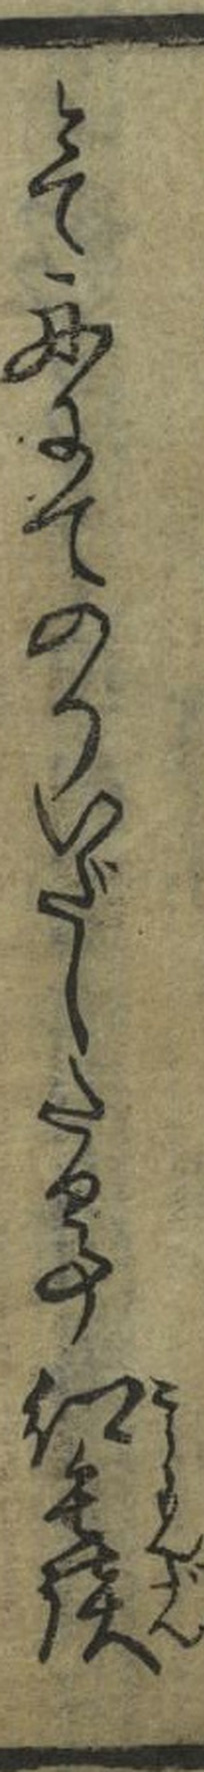とて舟にてのりいだしたる事紅毛談
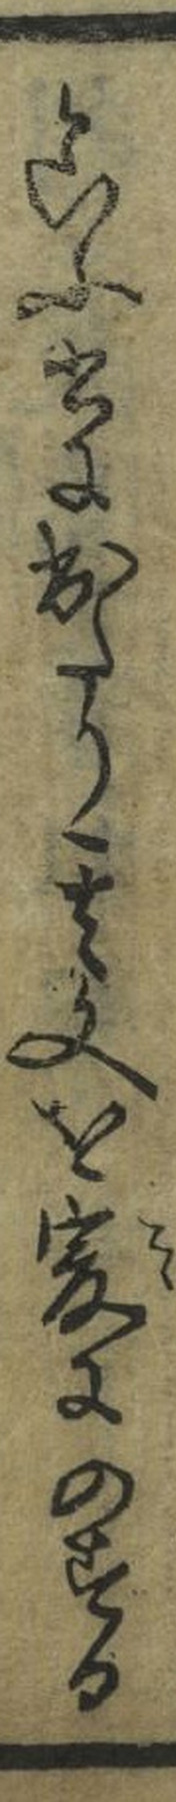といふ書に出たり其文を爰にのする
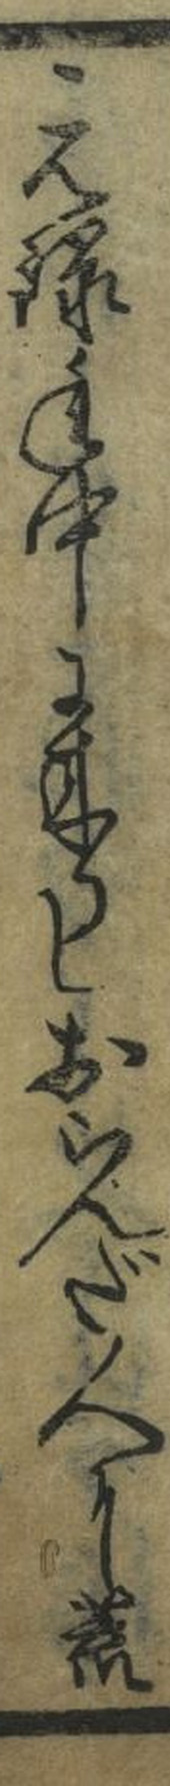元禄年中に来りしおらんだじんに荒
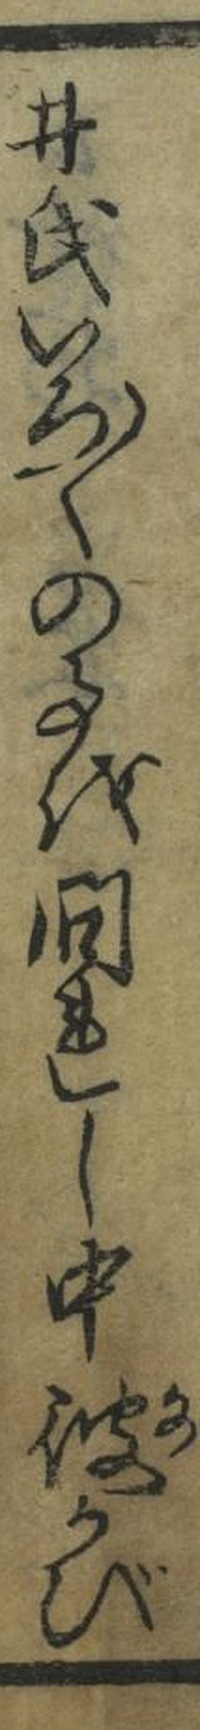井氏いろ〳〵の事を問れし中彼かび
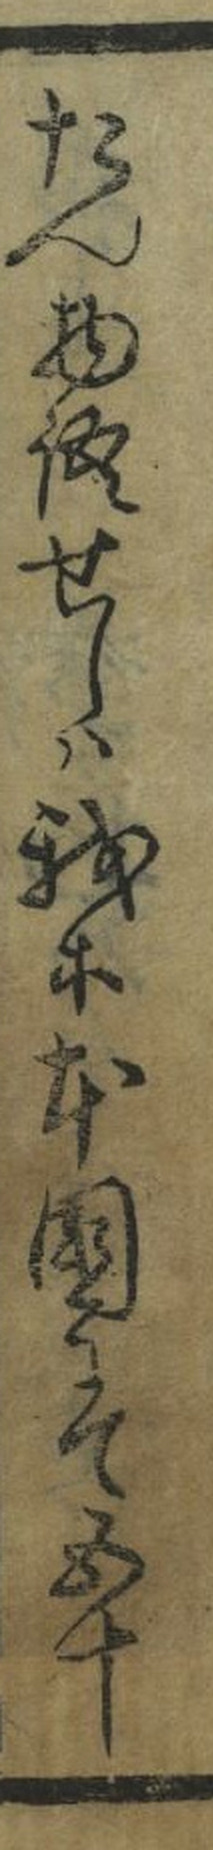たん物語せしは我等本国にて五十
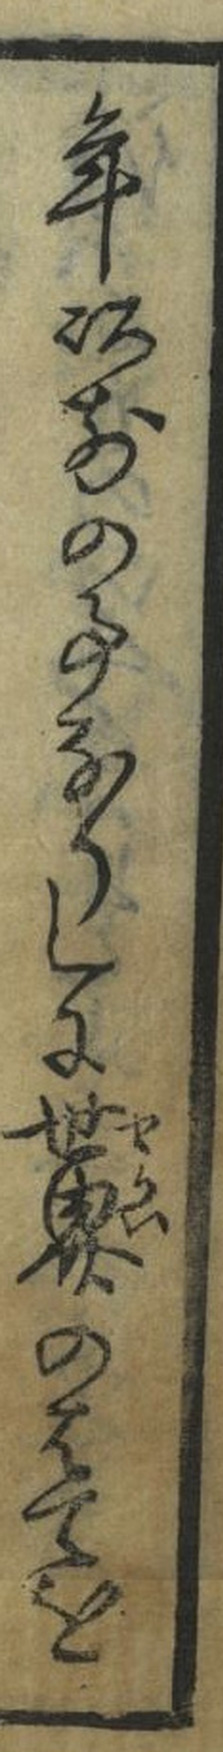年以前の事なりしに世界のはてを
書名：琉球雑話
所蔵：University of the Ryukyus Library
